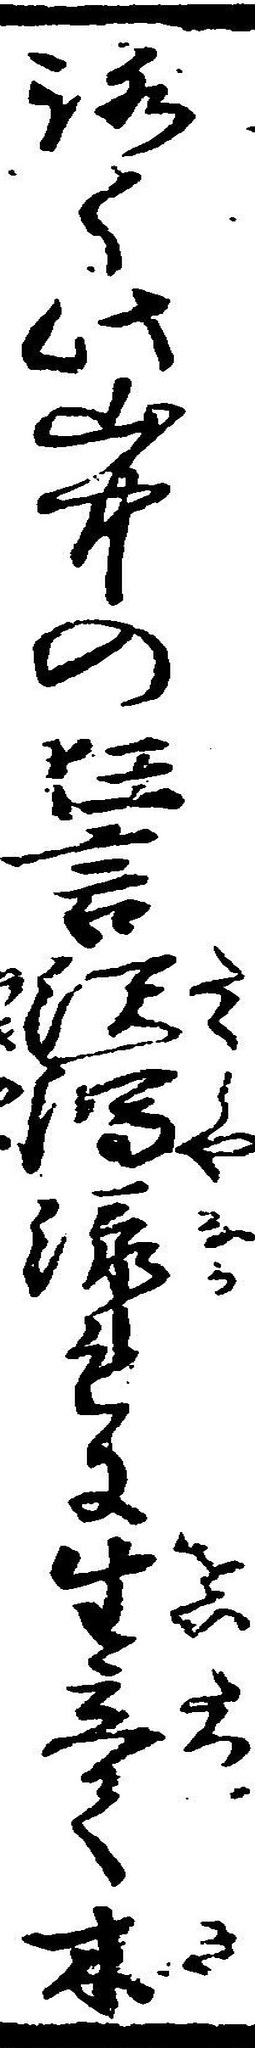ろく此山中の狂言沢瀉流れに生立て木
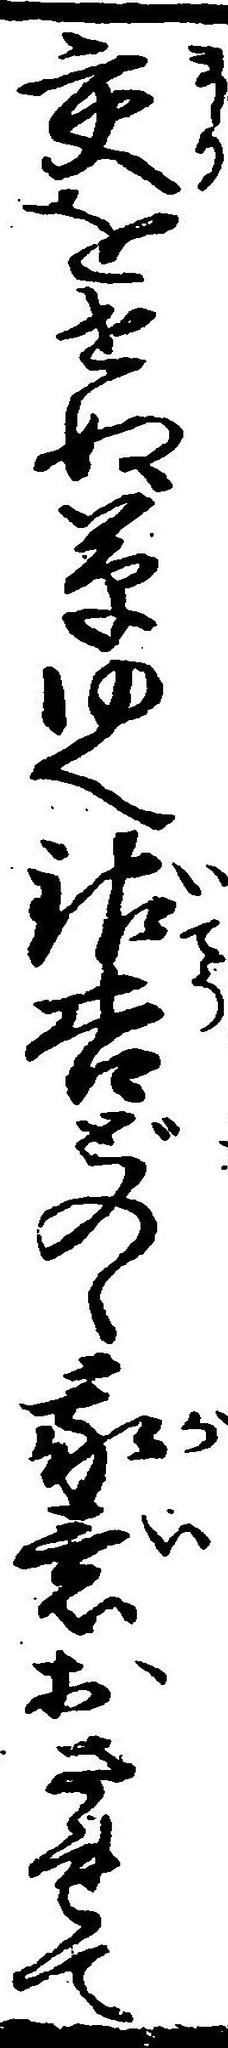交をせぬ草ゆへ銀杏どのゝ我意おされて
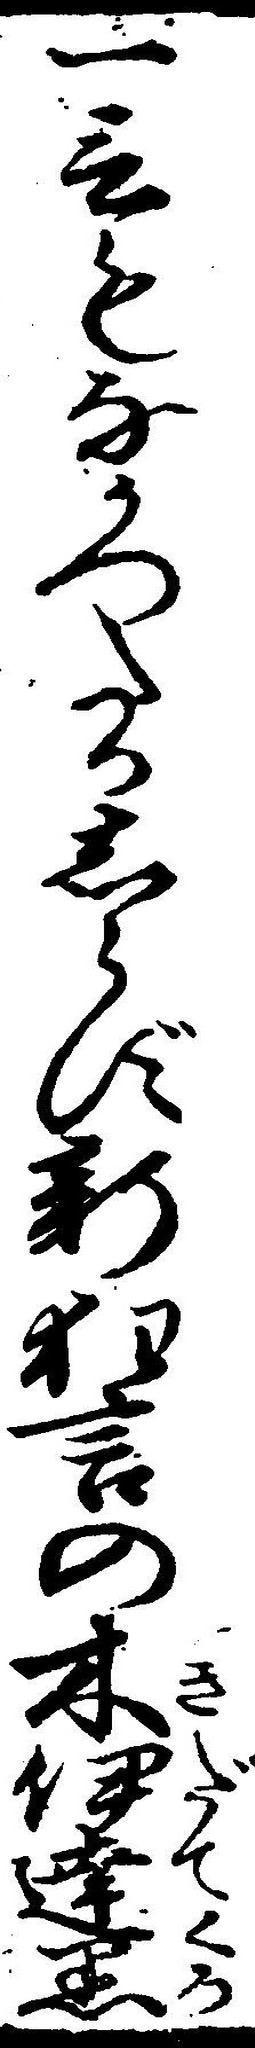一言もなかつたかしらず新狂言の木伊達黒
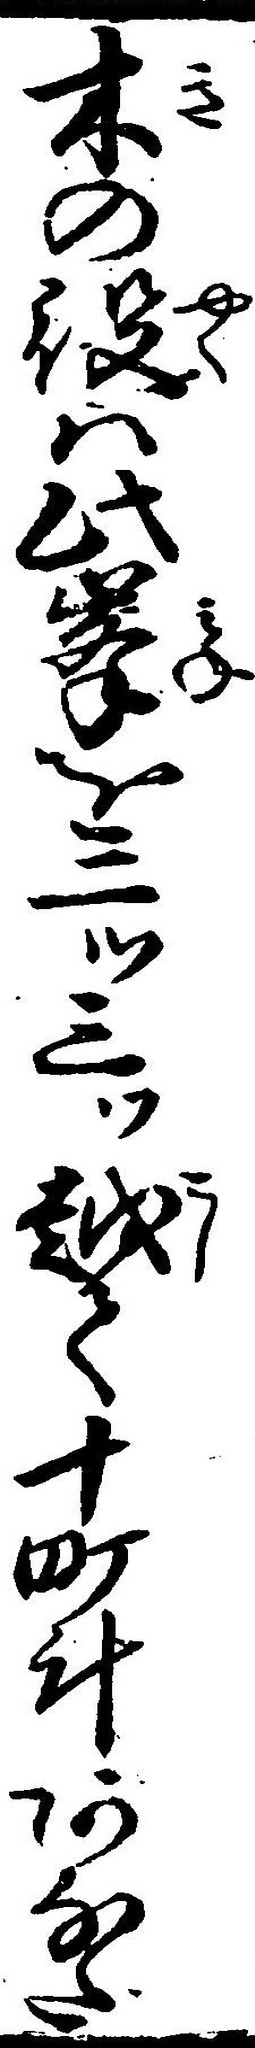木の役は此峯を三ッ三ヮ越て十町斗あなた
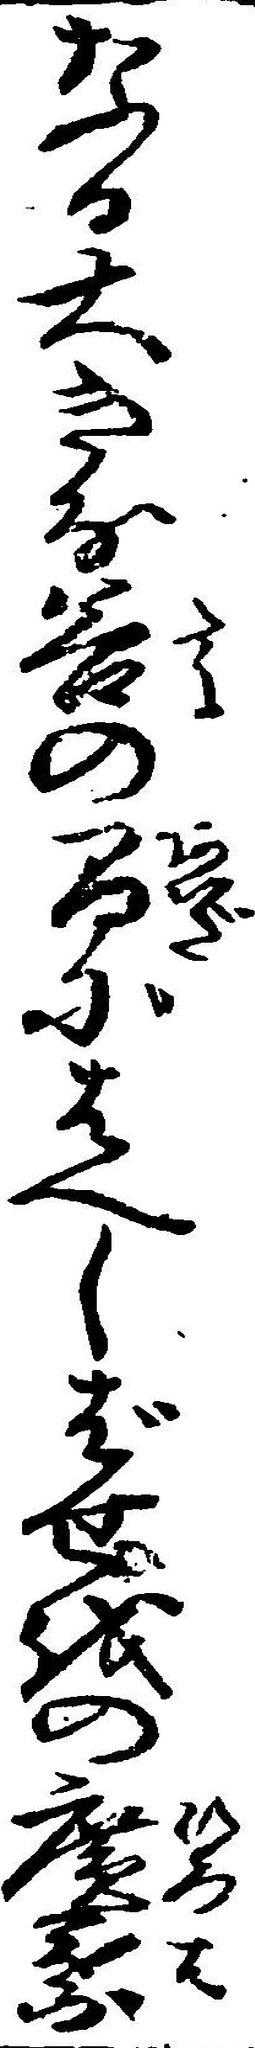なる大きな谷の間にはへしばせをの広葉
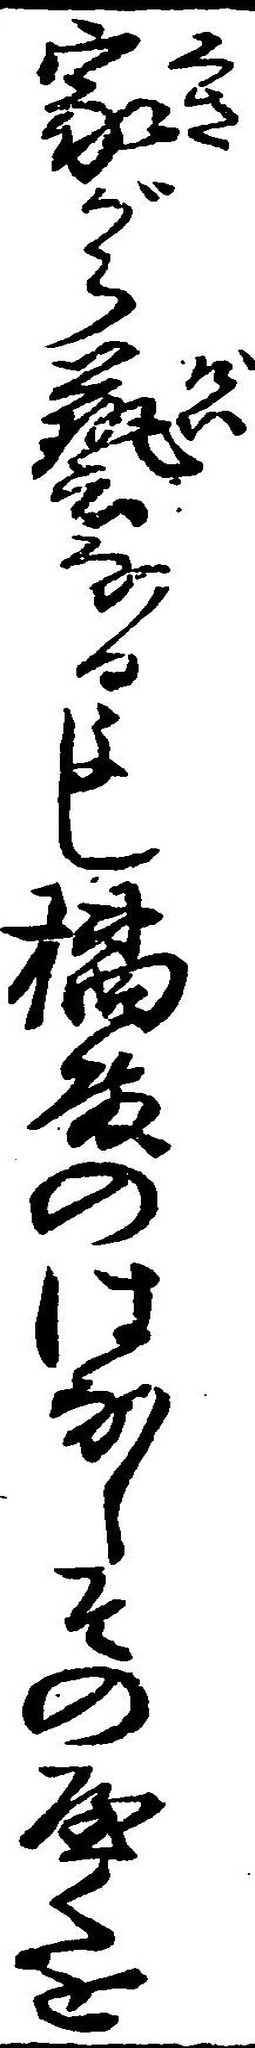家がら芸なるよし橘殿のはなしそのやくを
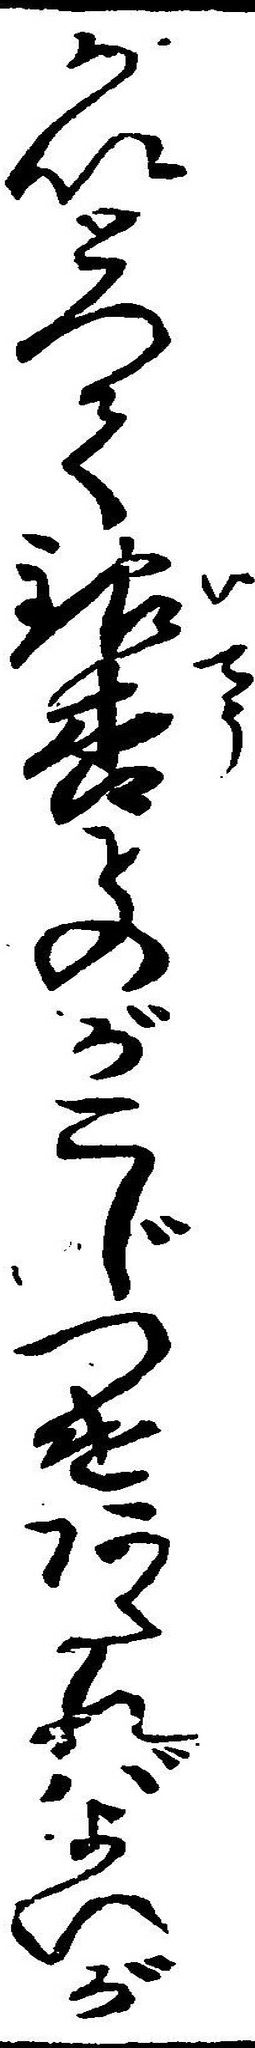かいとつて銀杏とのがこじつけあたればよいが

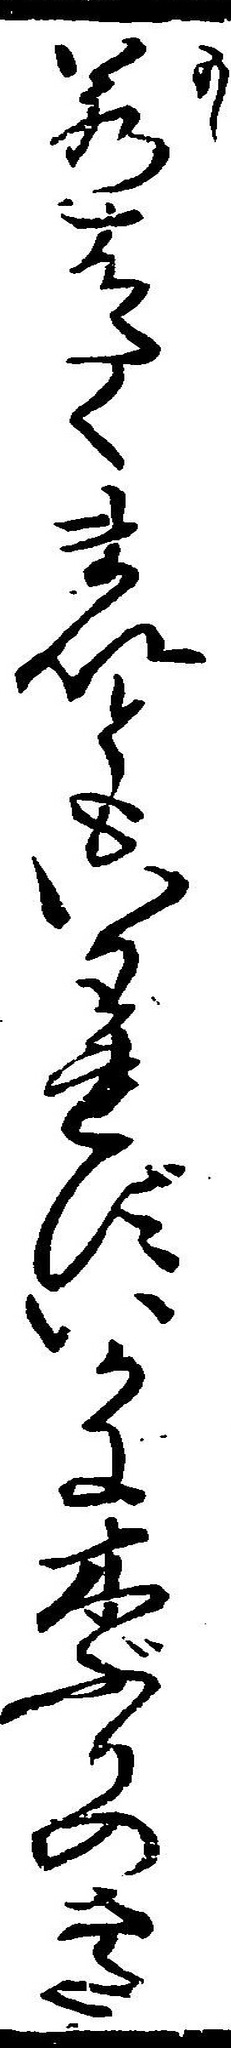若はたくまいともいわれずいかに木ぶりのさた
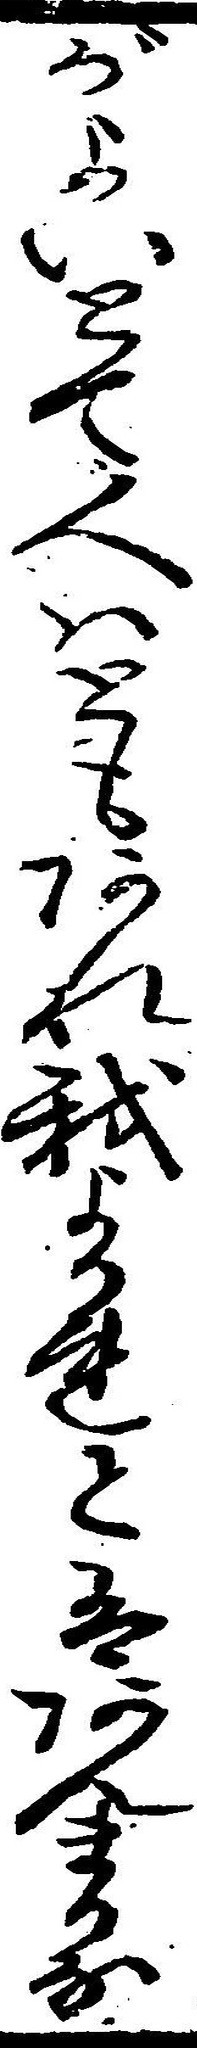がよいとて人はともあれ我よかれとはあんまりな
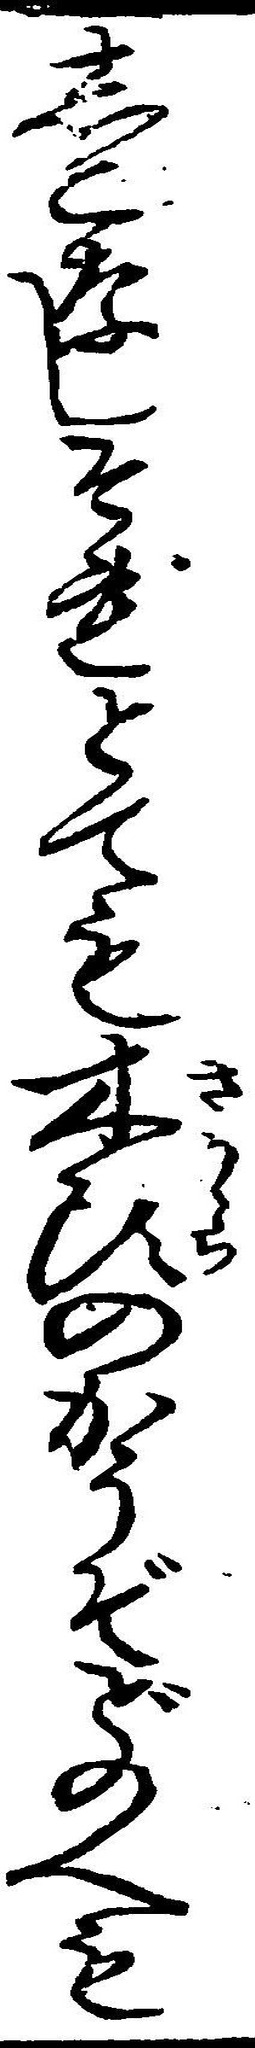しこなしそれとても木頭のかうぞどのへも
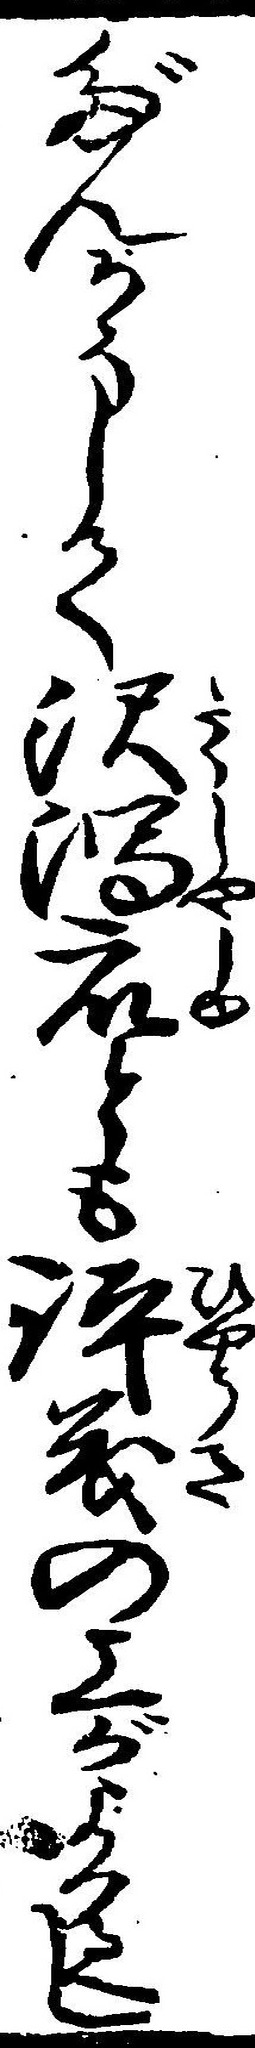だんかうして沢瀉衆とも評義の上がよかるへし
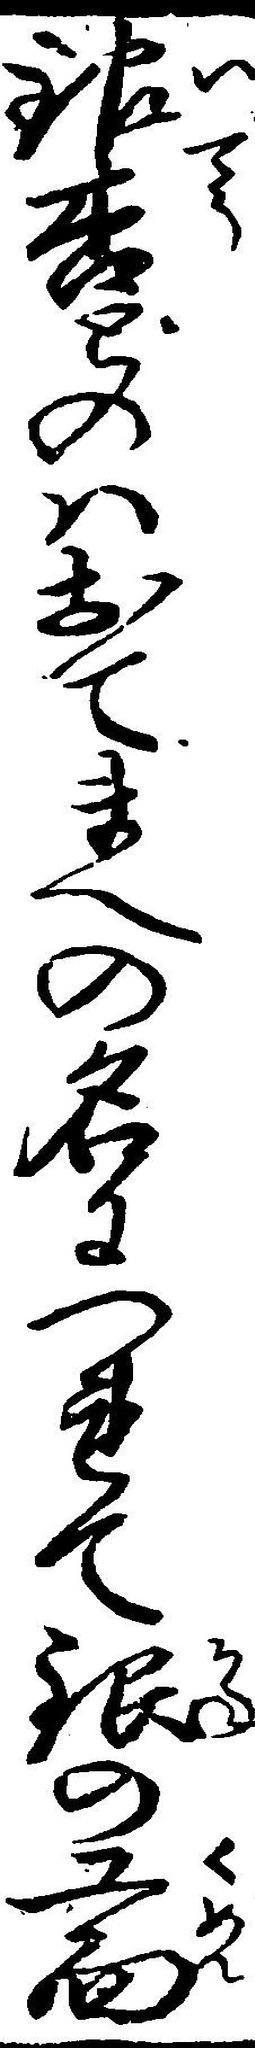銀杏どのはおてまへの名につれて銀の工面
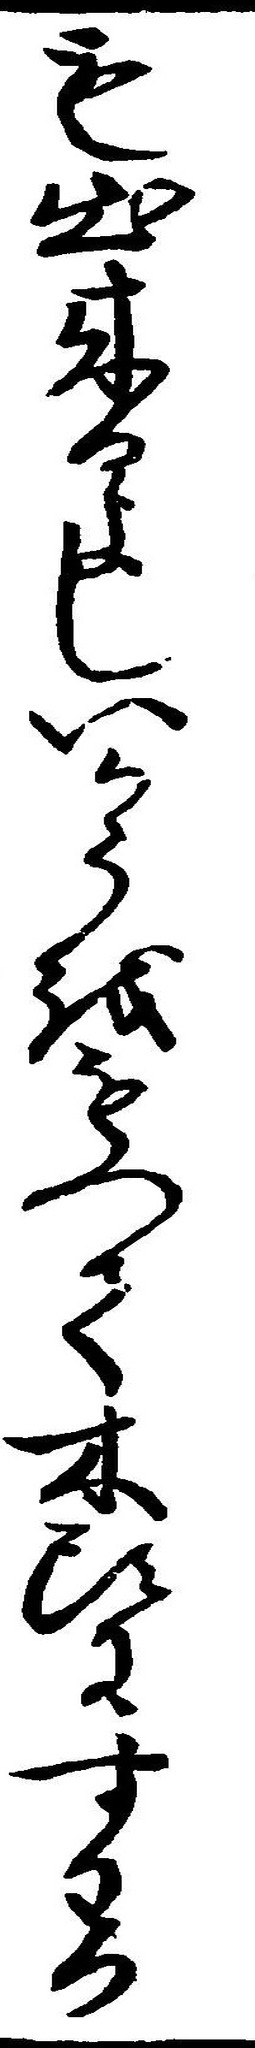も出来るよしいかうをもつて木頭にすわり
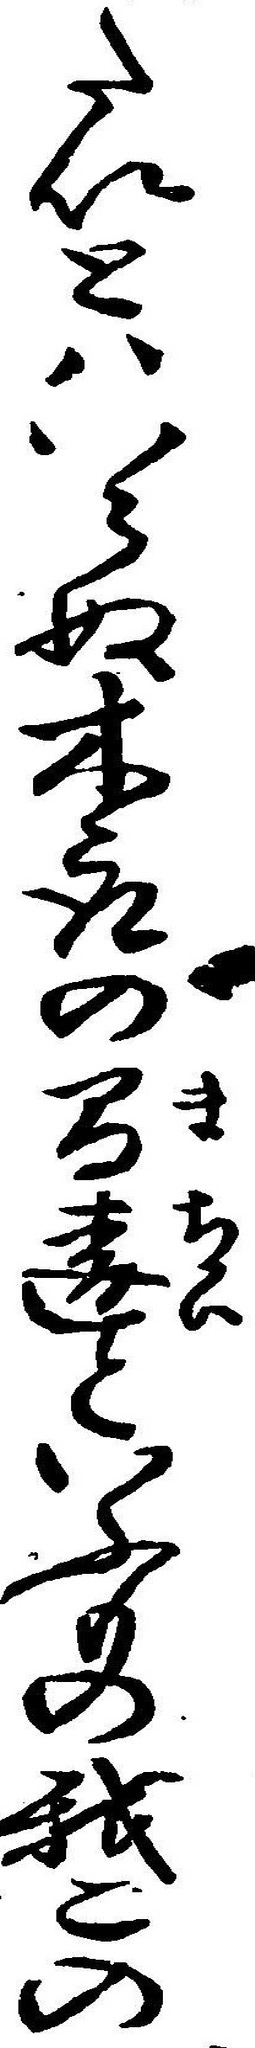たいとはいらぬ木取の間違といふもの我この
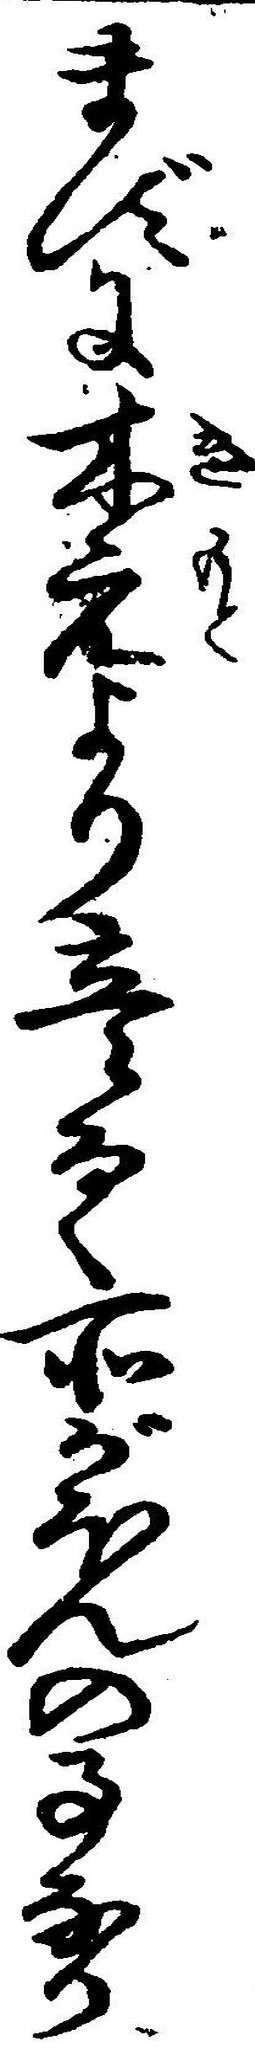まづに木元より立らるゝ所がほんの事なり
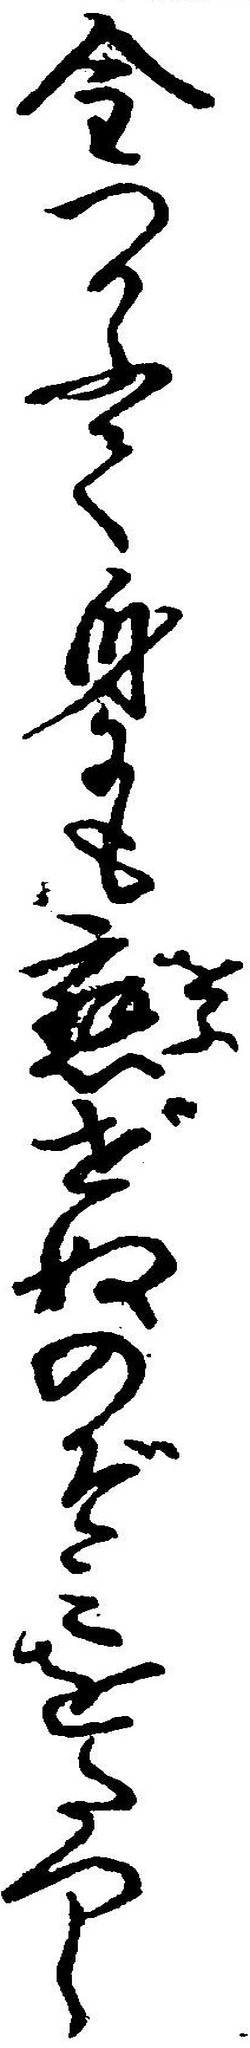金つかふて身にも応ぜぬのぞみをたつし
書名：草木芝居化物退治 / 泉花堂三蝶(十六兵衛)作
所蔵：東京大学総合図書館 General Library in the University of Tokyo, JAPAN
